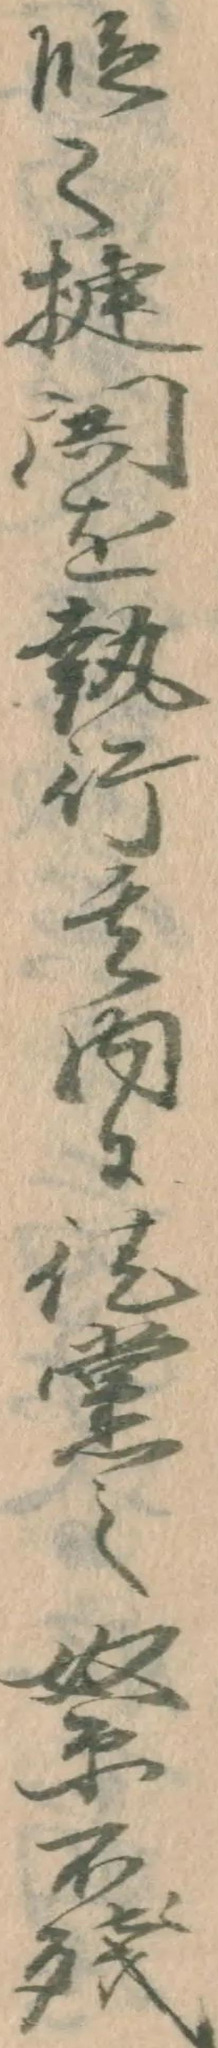段々捷鬨を執行其内尓徒党之奴原不残
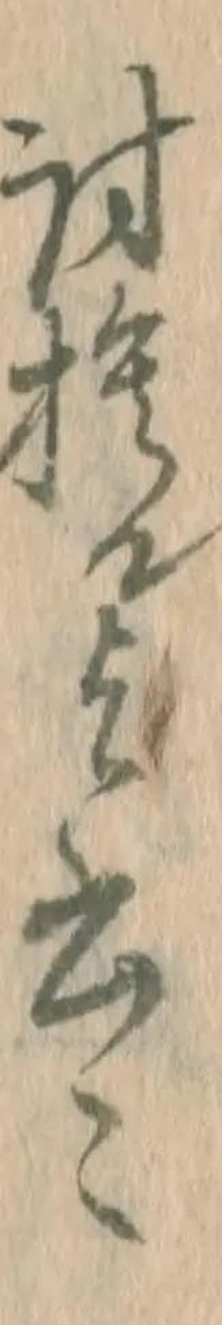討捨る与云々
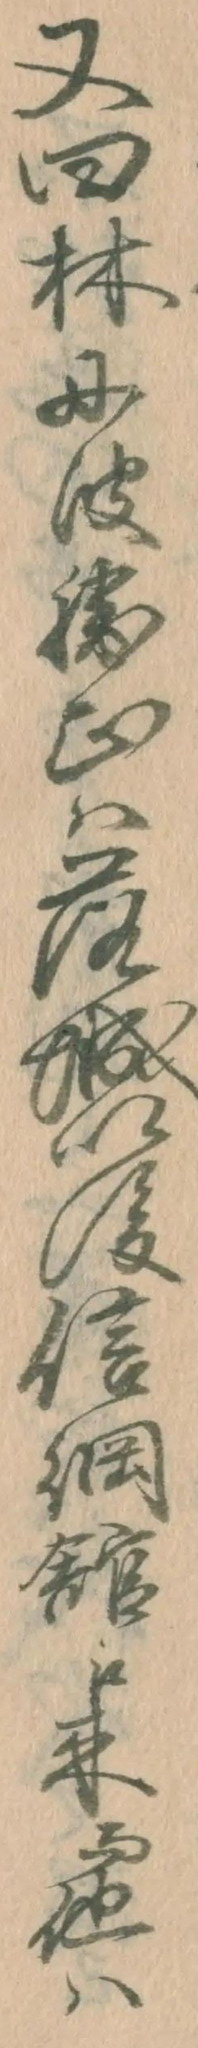又曰林丹波勝正は落城以後信綱館江来而他は

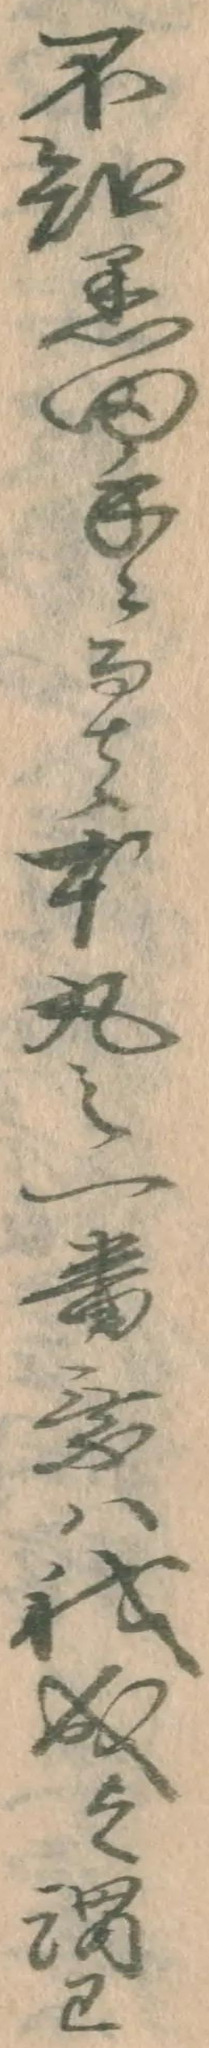不知黒田手に而者本丸之一番乗は我成与謂已
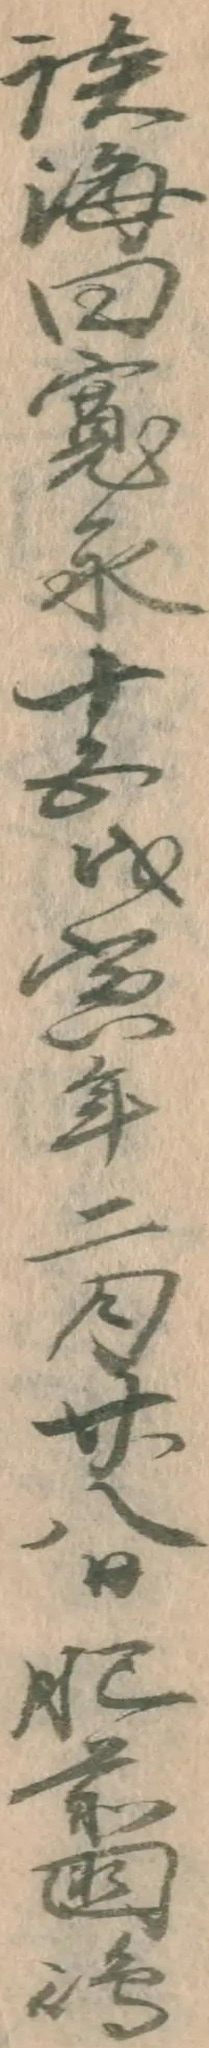談海曰寛永十五戌寅年二月廿八日肥前国島
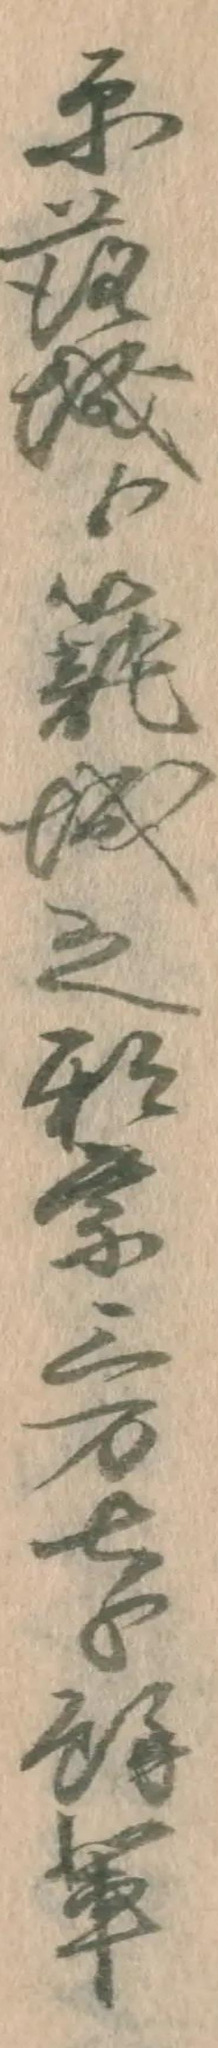原落城ゟ籠城之邪乗三万七千余軍
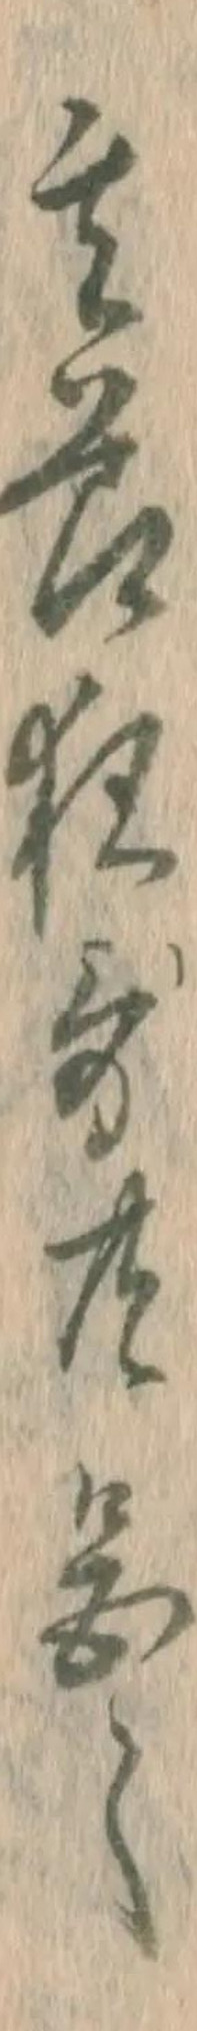其節夜寄共色々
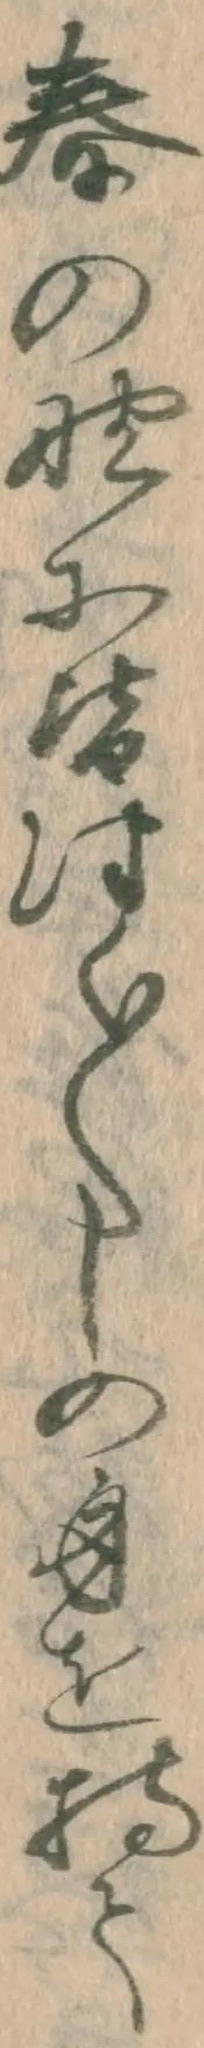春の野尓皆津く〳〵しの身を持て
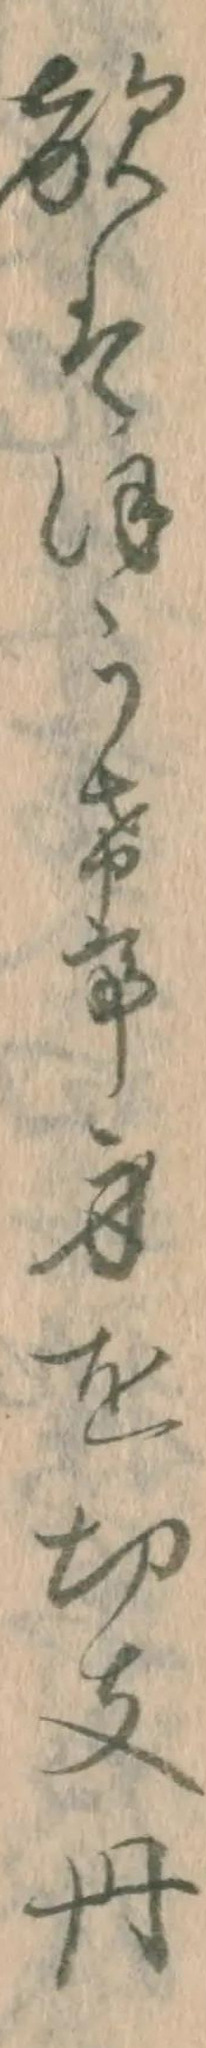敵盤ほう希亭身を切支丹
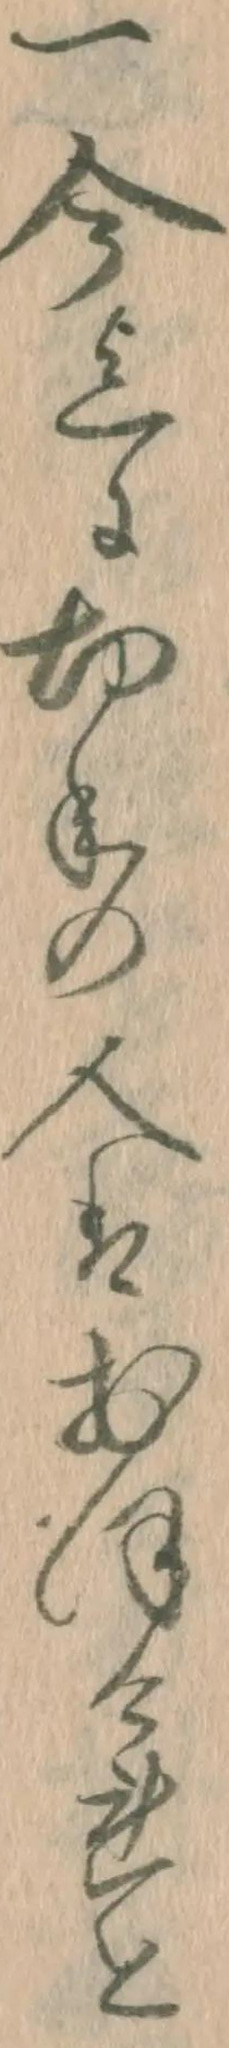一今迄尓切手の人盤お津介連と
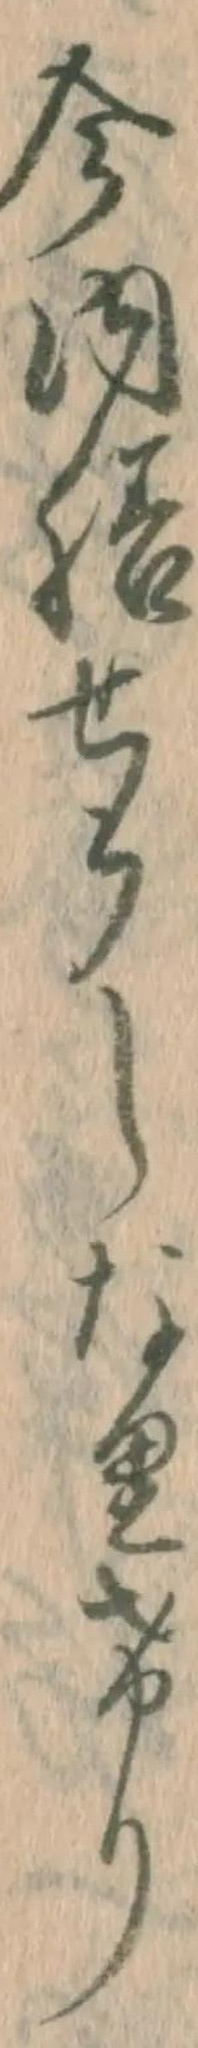今内膳せらしな里希り
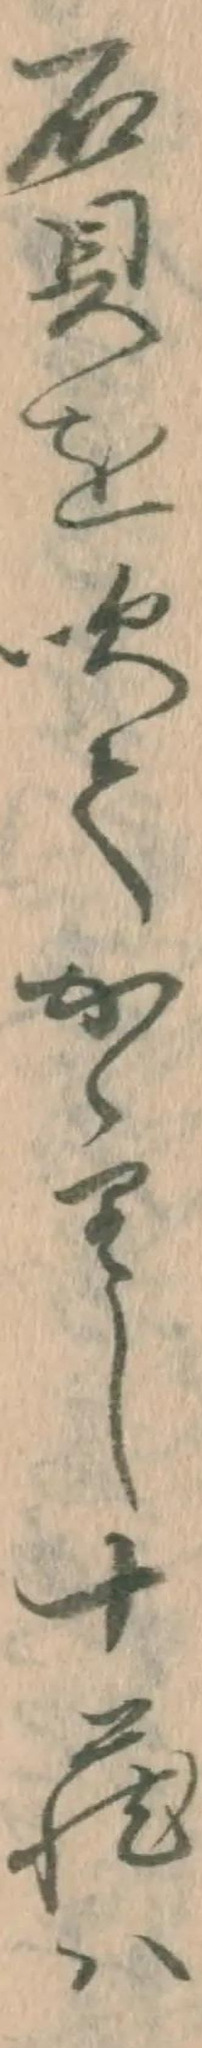石貝を吹てかゝ里し十蔵は
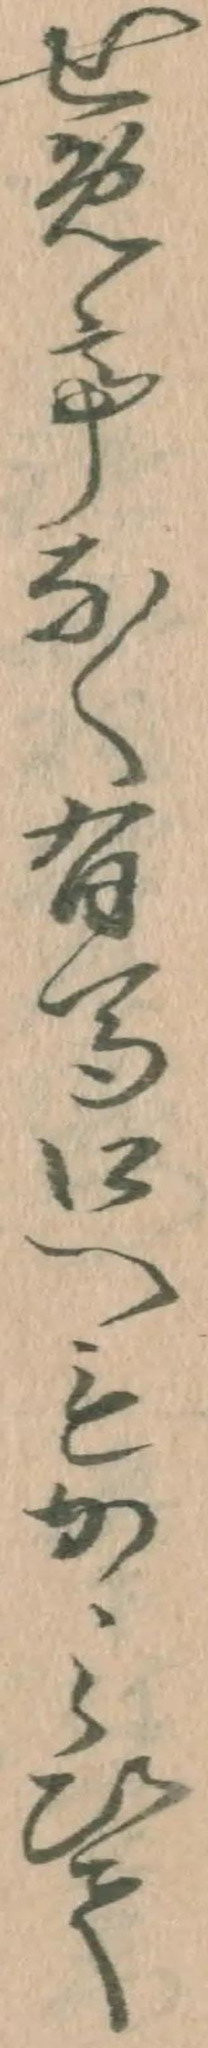せ免亭なく有馬口へもかゝらひて
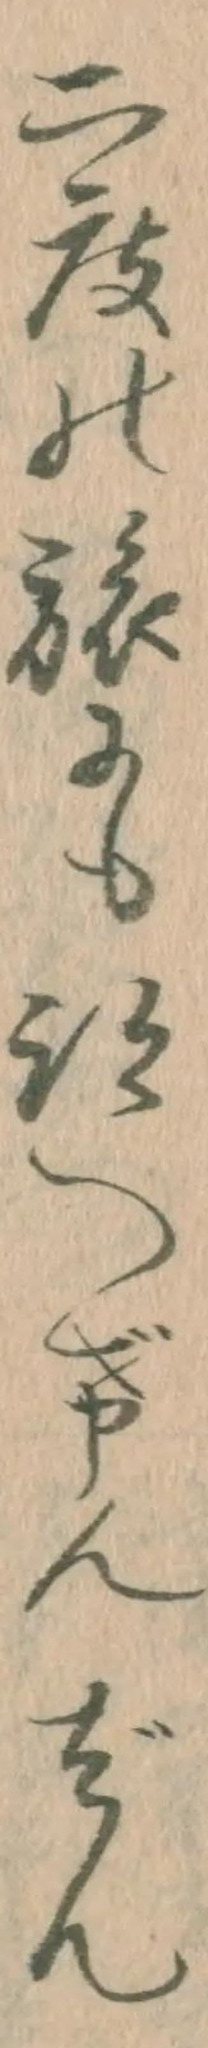二度能度尓も跡へげんばん
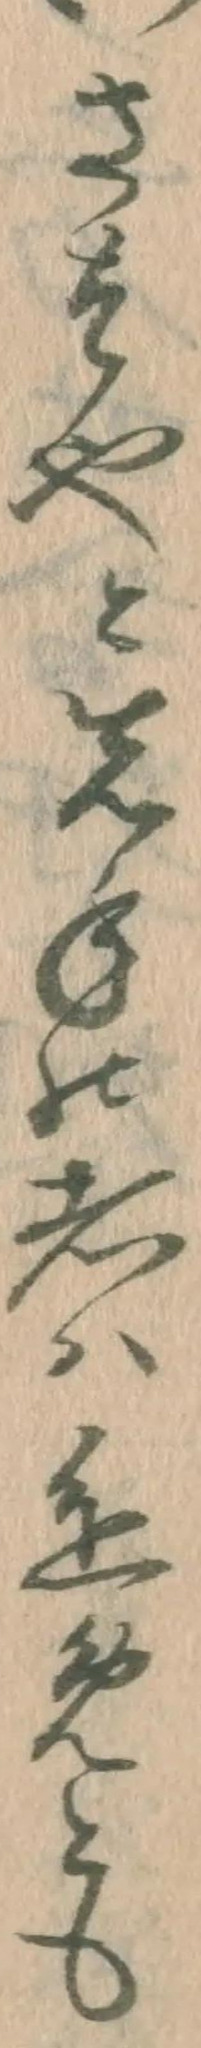いさ者やと先手能者は進免とも
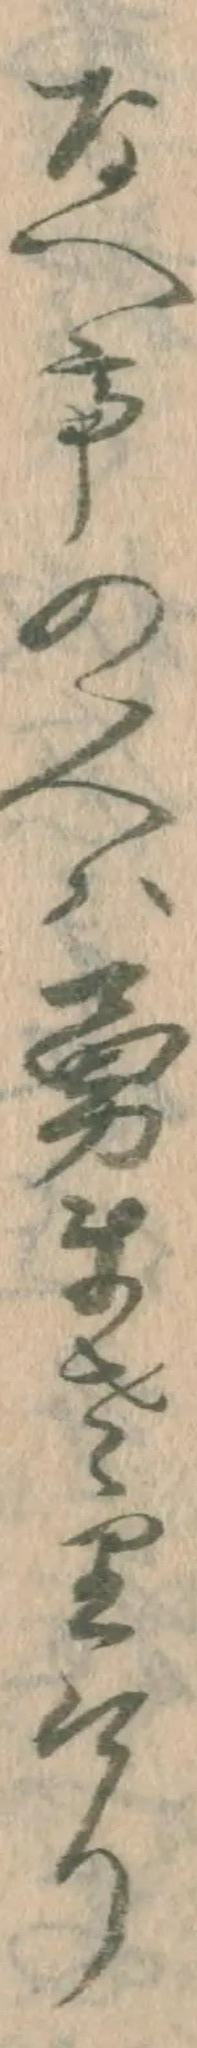なへ亭の人は勇まさ里介り
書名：切支丹御退治記 49巻. [8]
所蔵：国立国会図書館 National Diet Library, JAPAN
